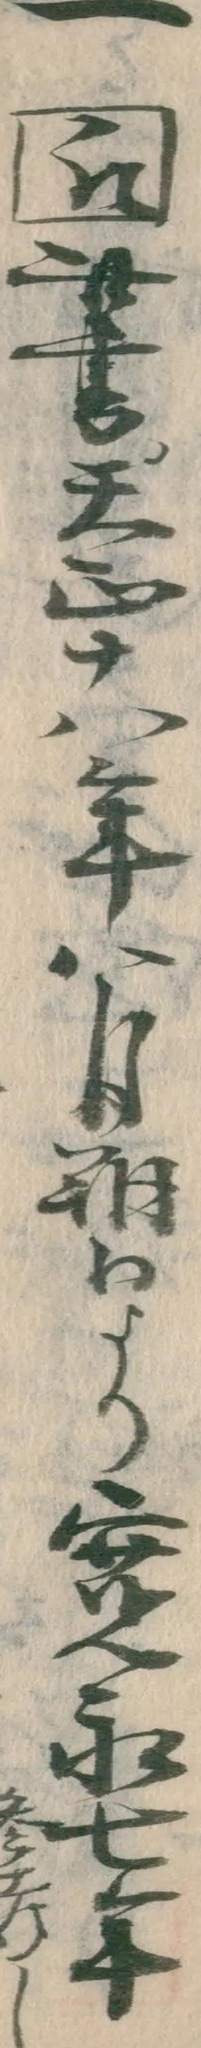一凡書は天正十八年八月朔日より寛永七年
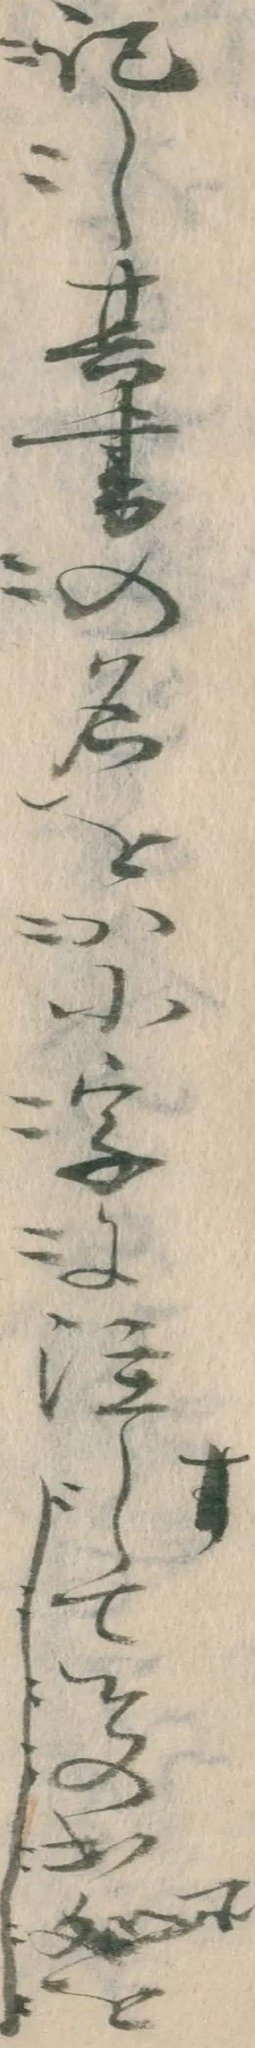記し其書の名をは小字に注してその出所を

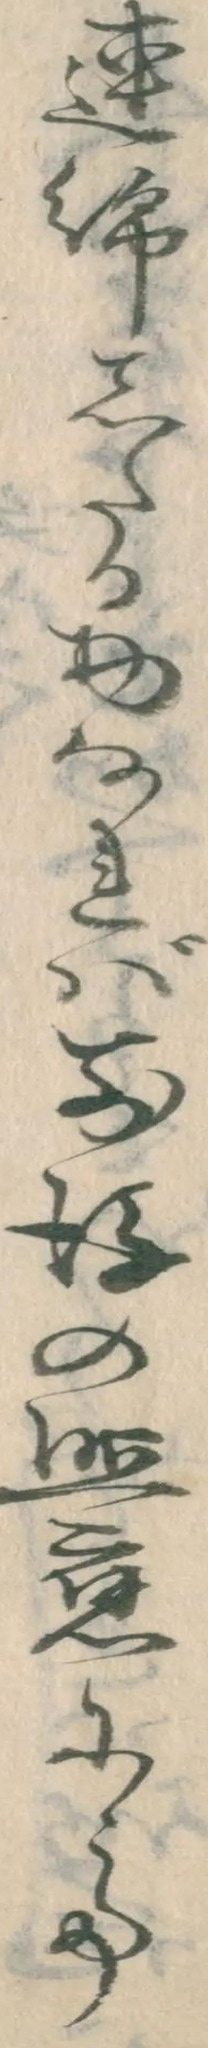連綿したる物なれば前後の照意にて
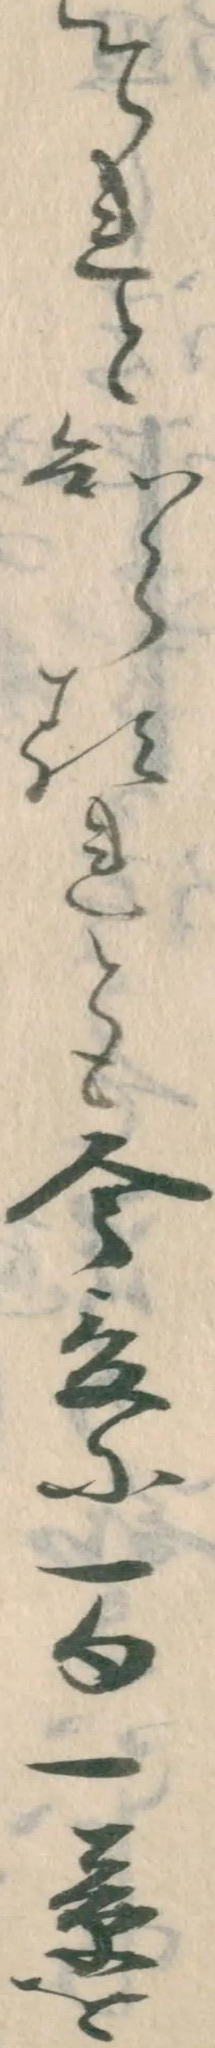それと知らるれとも今爰に一句一章を
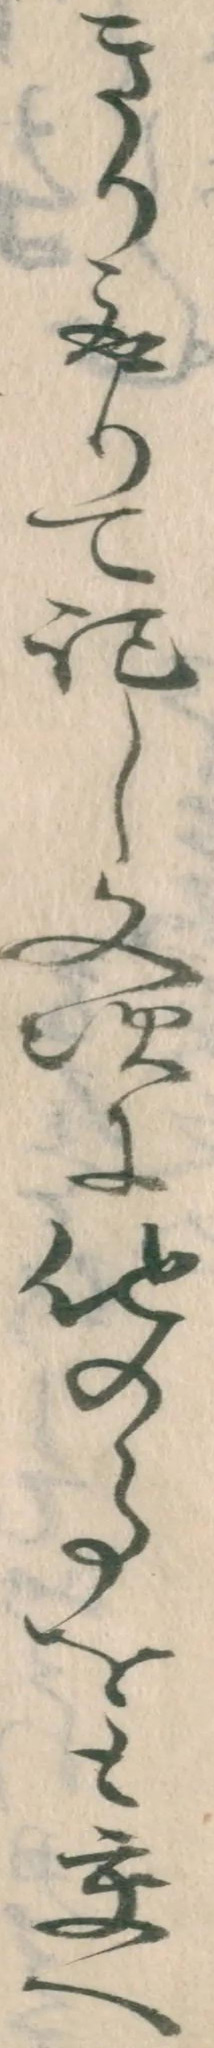きり取りて記し又次に他の事をも交へ
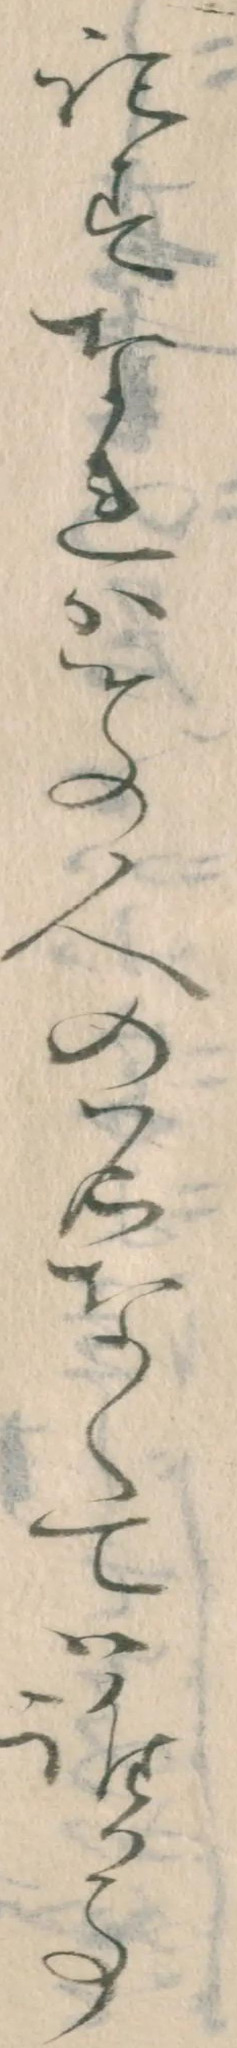記すなれはその人の名なくては誰か事
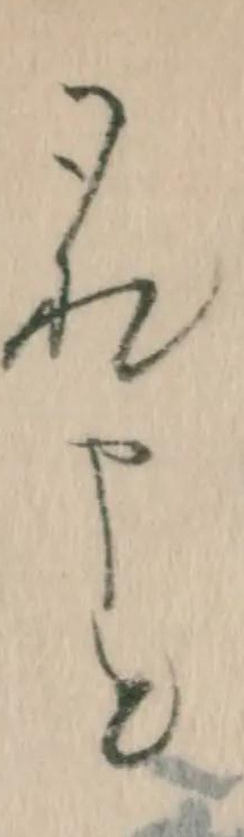御礼申と
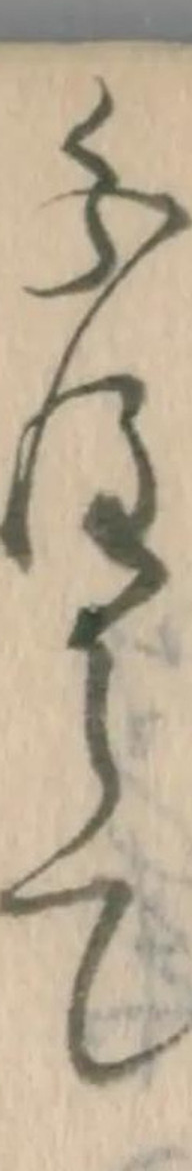分はして
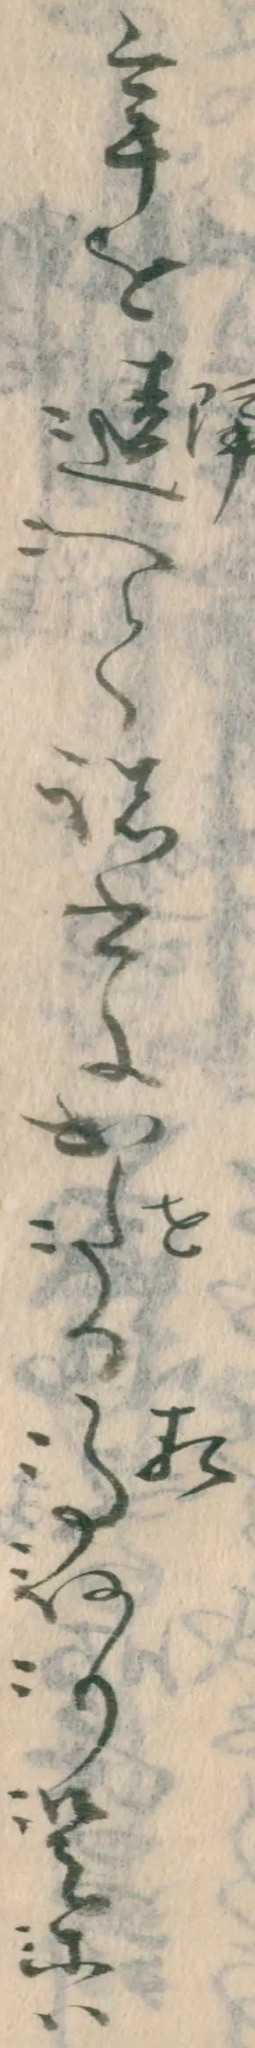年を違へ隔て諸書に出たせる事あり是に類は
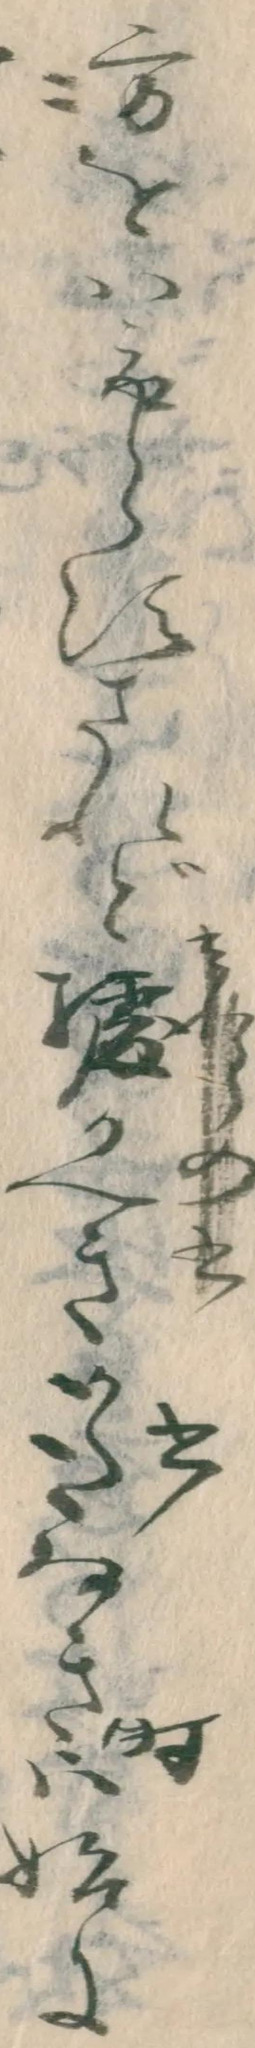方をは取らすされど拠るへきかた書なき・は始に

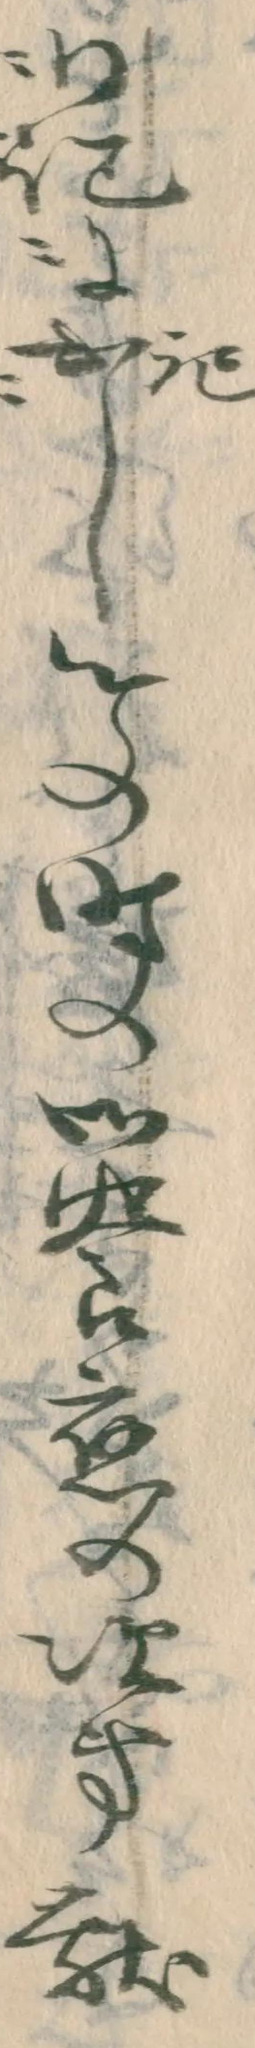日記に出記しこの時の御饗応の次第
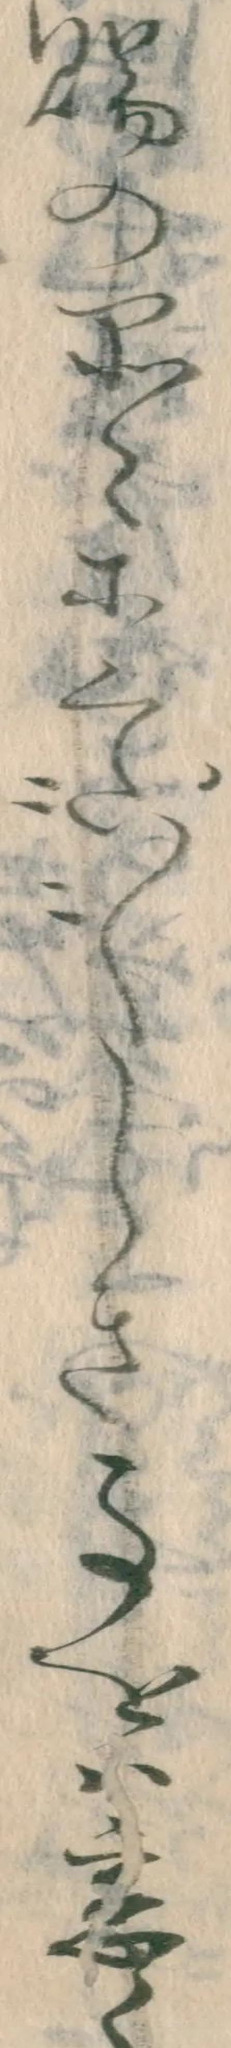賜の品々にくたしはしき事をはく
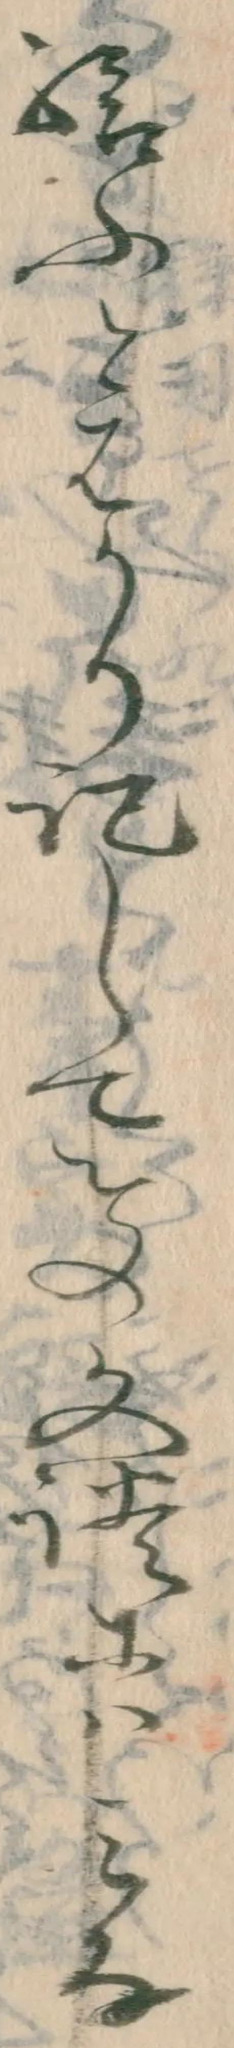御書を給ふとはかり記してその文にはみな
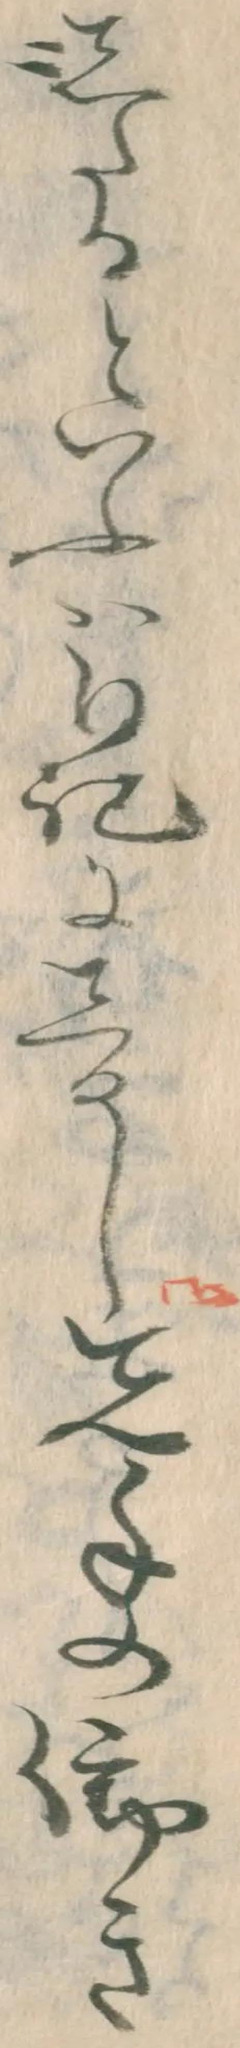志たるといふは日記にしるし御先手の働き

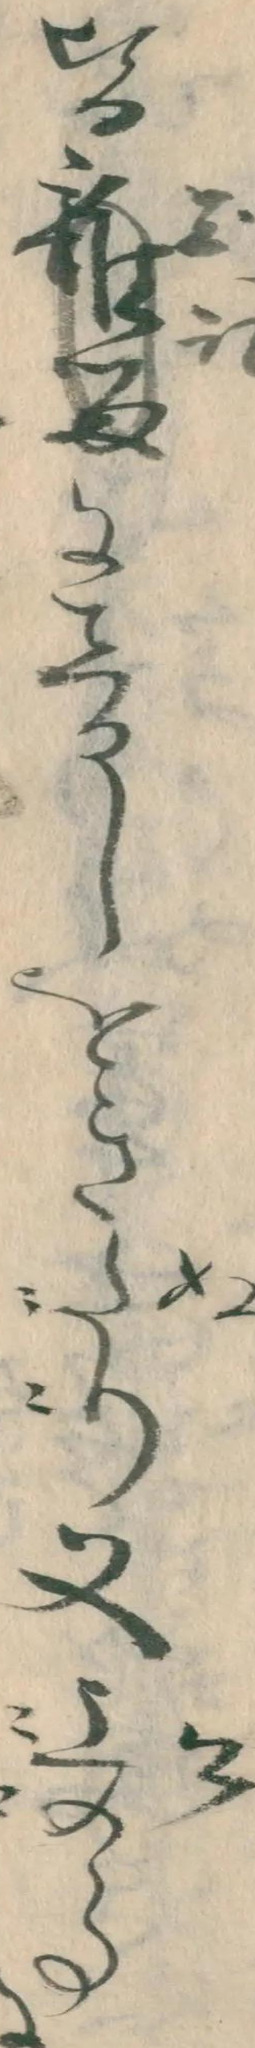皆別記にしるしをきたりぬ又上の事に
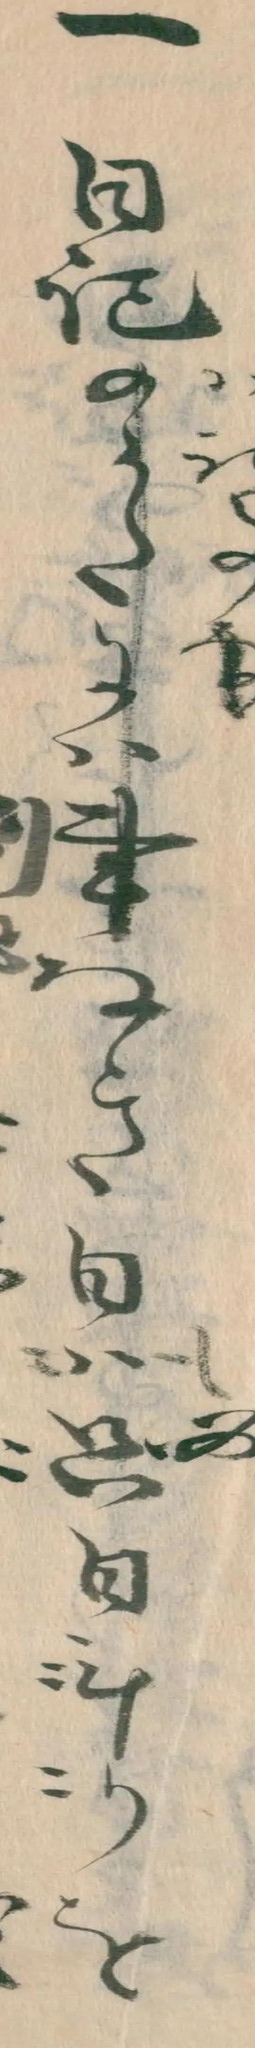一日記は記事なき日は只もふ日計りを
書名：輪池叢書. 12
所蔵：国立国会図書館 National Diet Library, JAPAN
